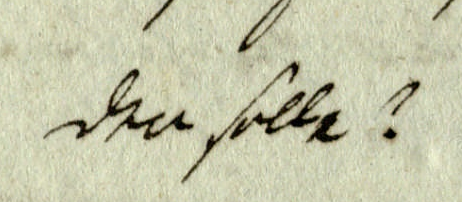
den solle?
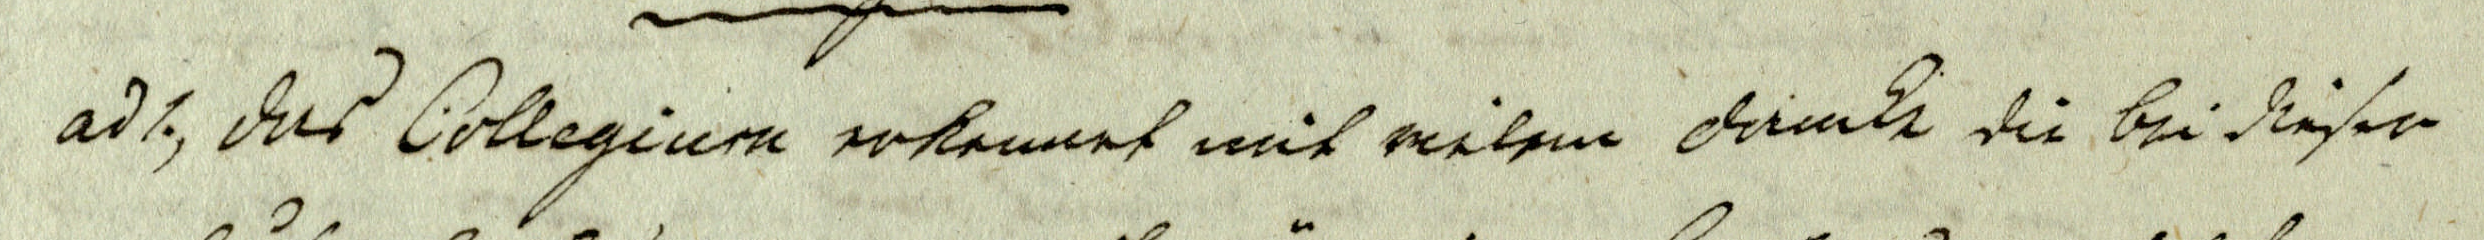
ad 1, Das Collegium erkennet mit vielem Danke die bei dieser
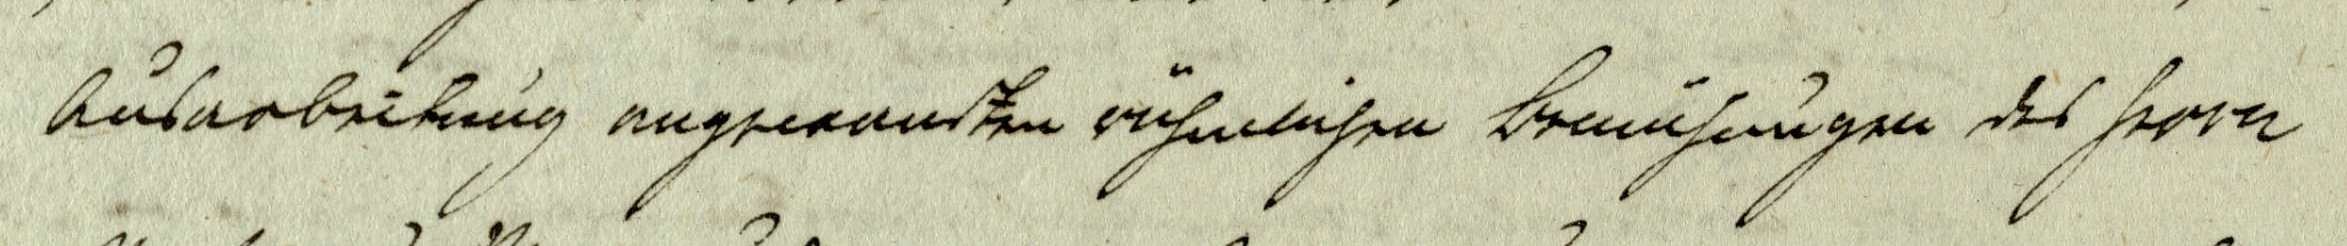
Ausarbeitung angewandten rühmlichen Bemühungen des Herrn
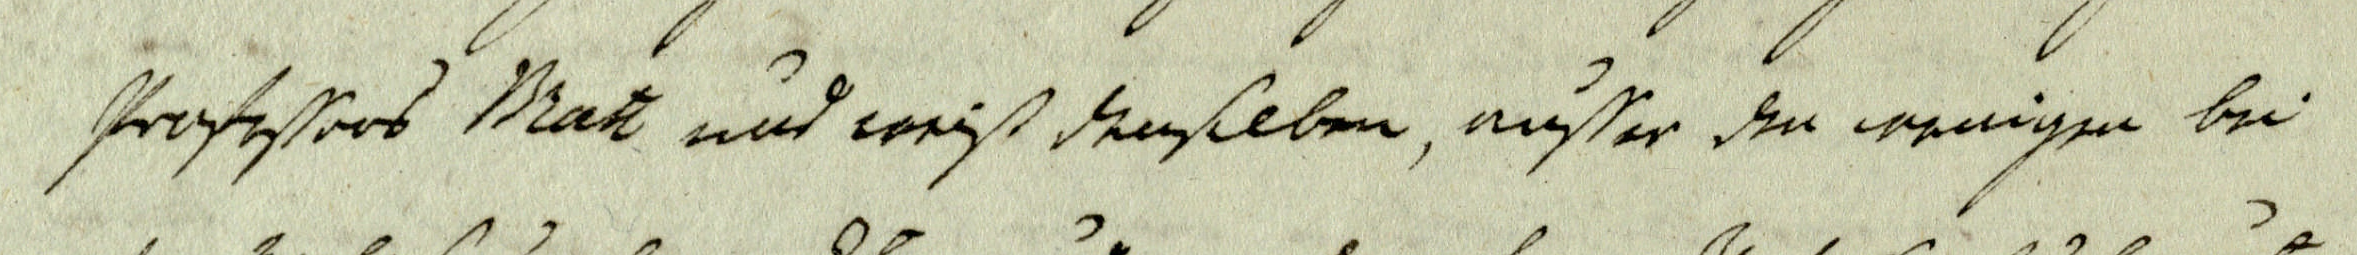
Professors Bratt und weiß denselben, ausser den wenigen bei
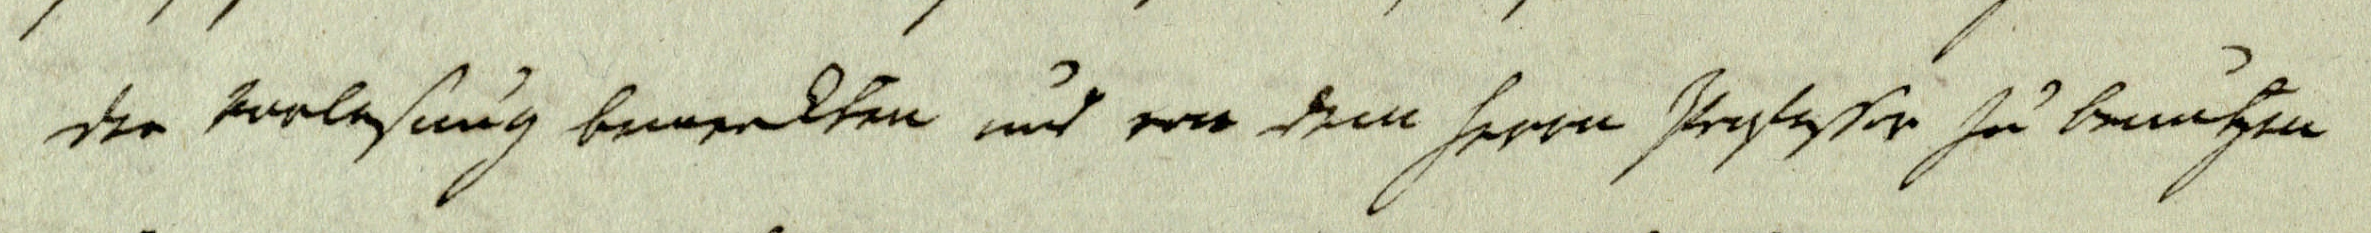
der Vorlesung bemerkten und von dem Herrn Professor zu benutzen
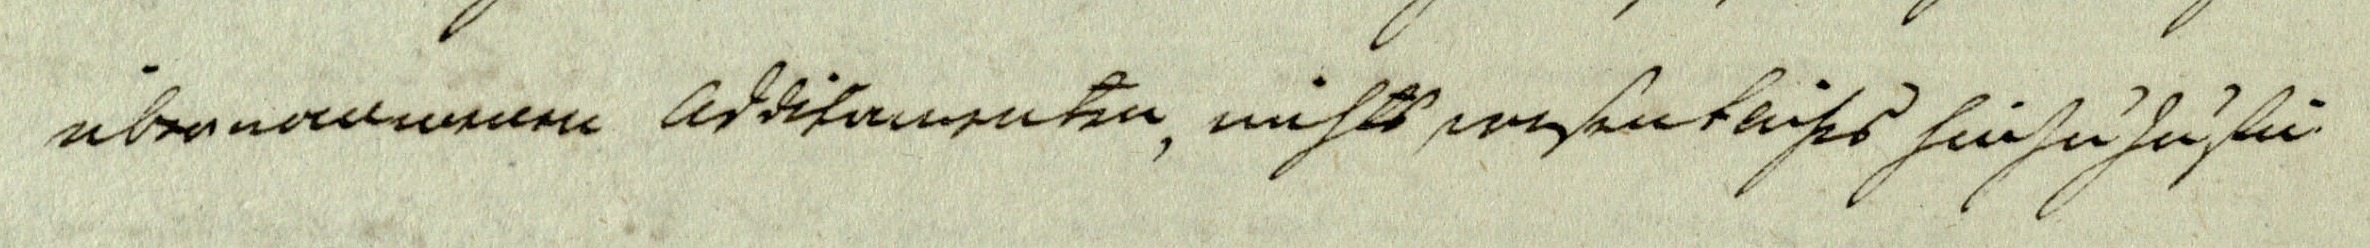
übernommenen Additamenten, nichts wesentliches hinzuzufü¬
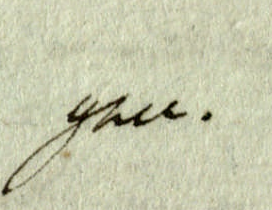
gen.
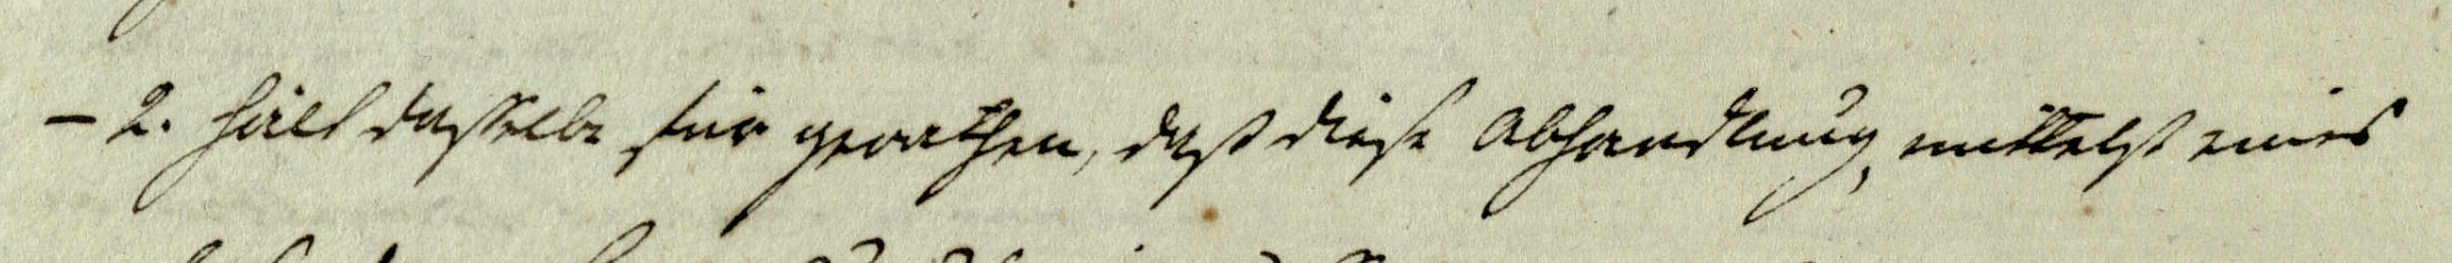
2. hält dasselbe für gerathen, daß diese Abhandlung, mittelst eines
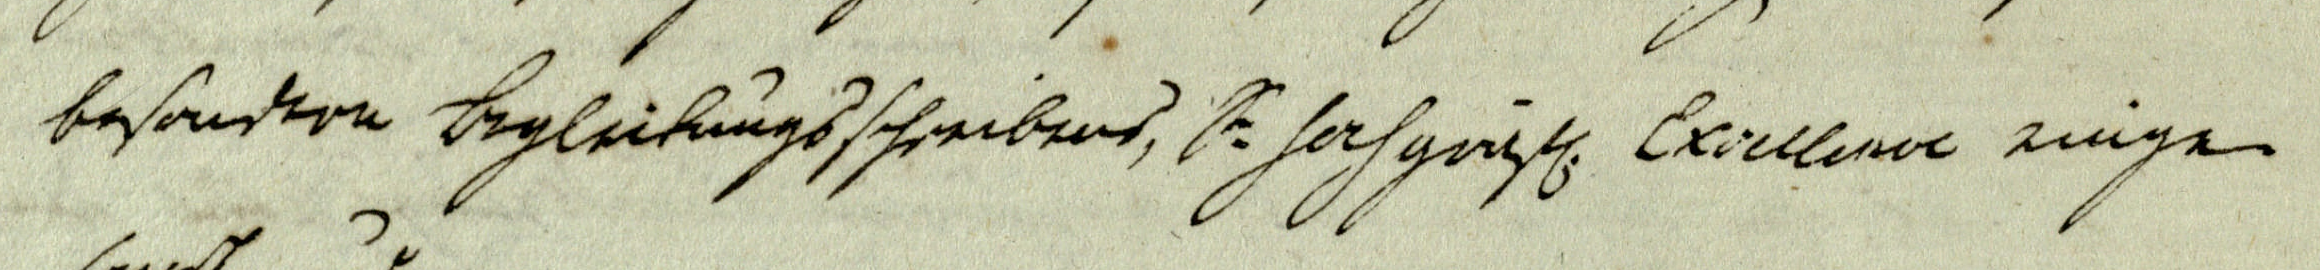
besondern Begleitungsschreibens, S. Hochgräfl. Excellence einge¬
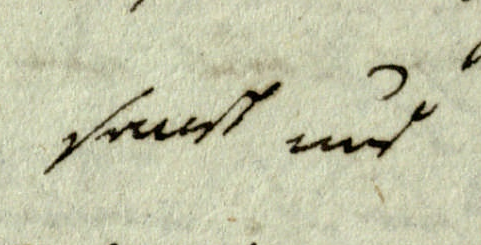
sandt und
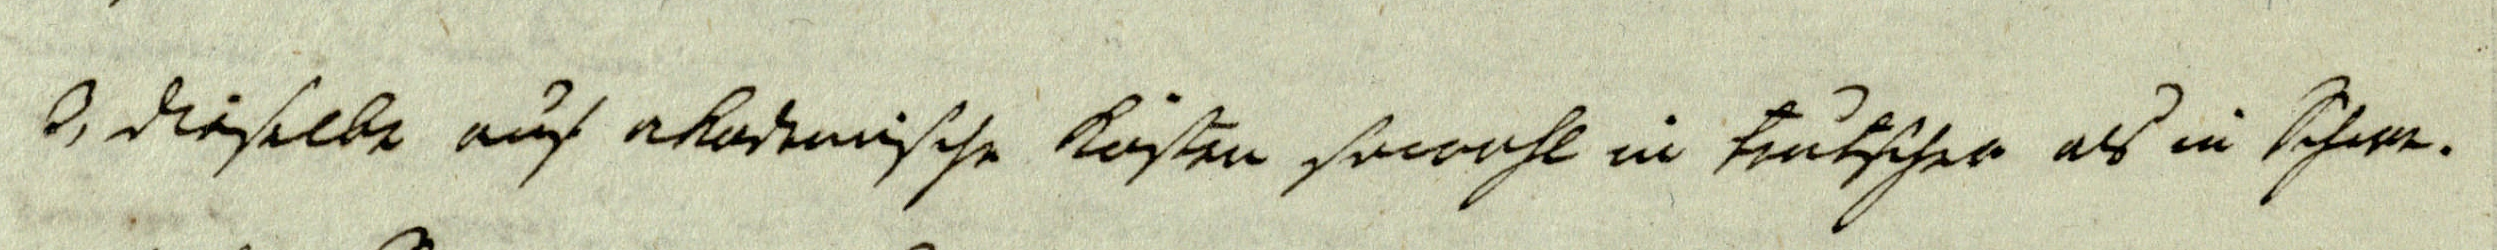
3, dieselbe auf akademische Kosten sowohl in teutscher als in Schwe¬
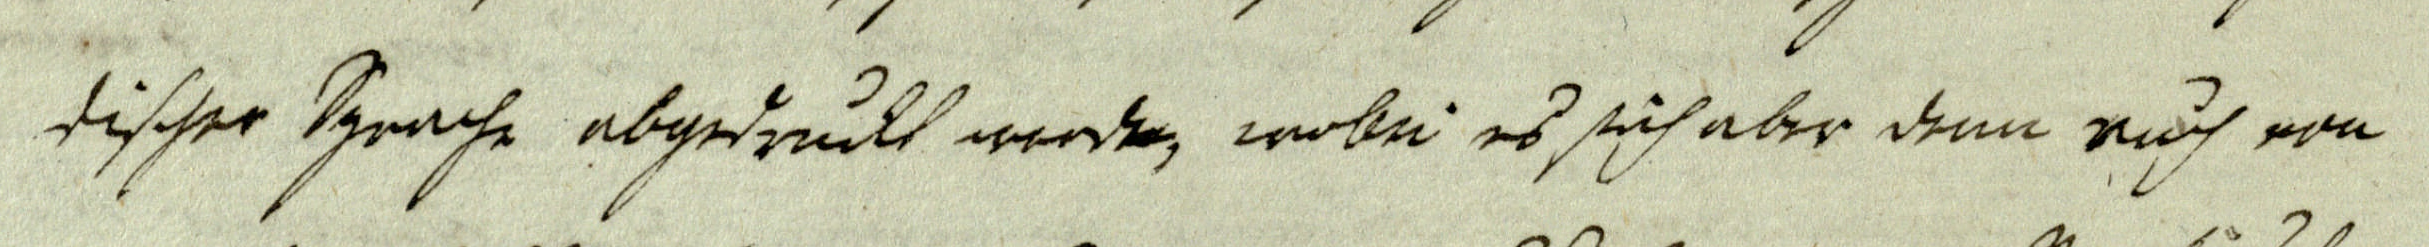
discher Sprache abgedruckt werden, wobei es sich aber denn auch von
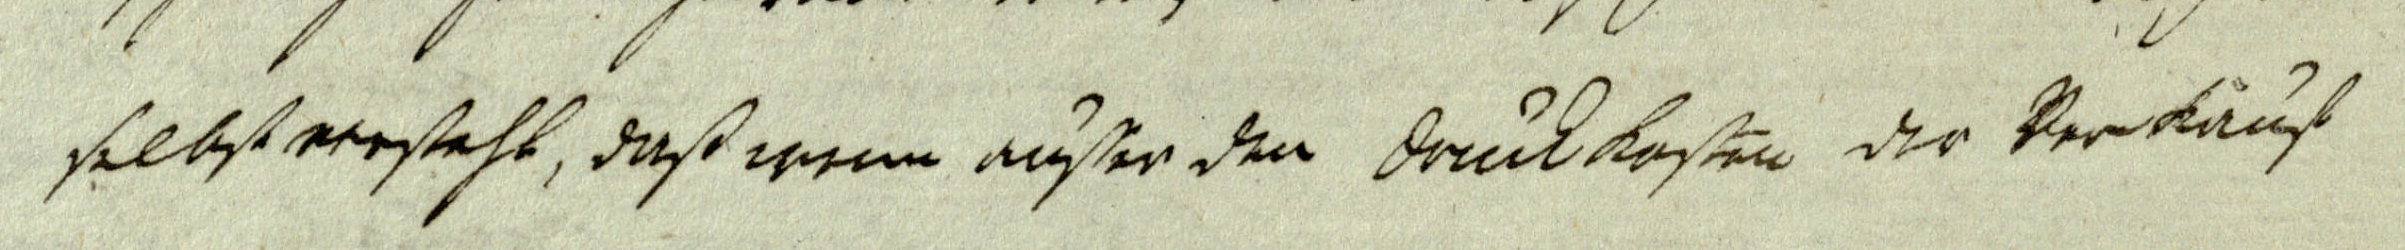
selbst versteht, daß wenn ausser den Druckkosten der Verkauf
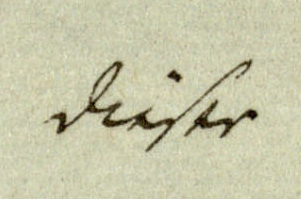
dieser
